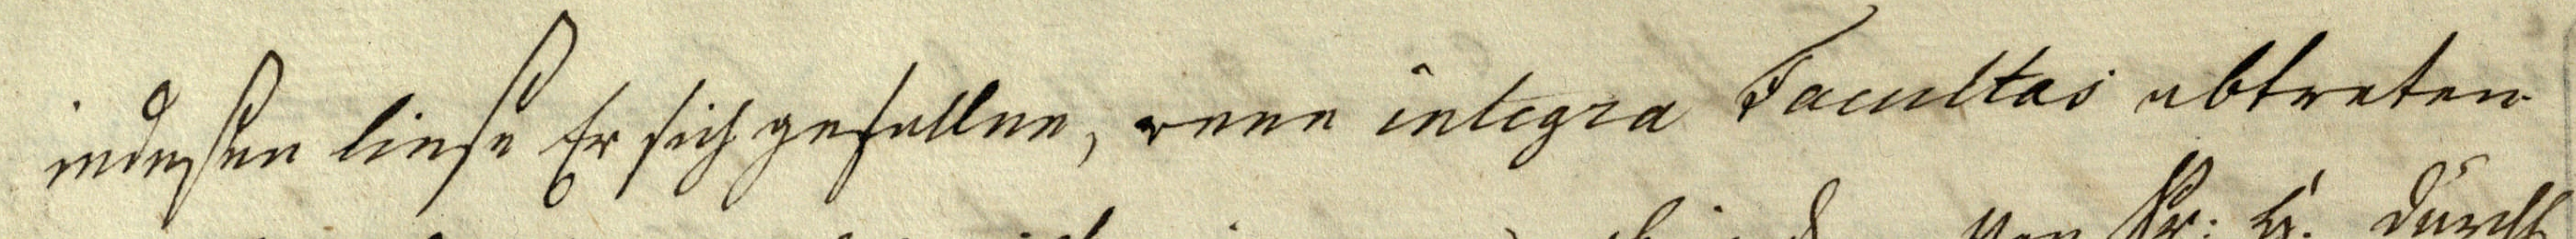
indeßen ließe Er sich gefallen, wenn integra Facultas abtreten
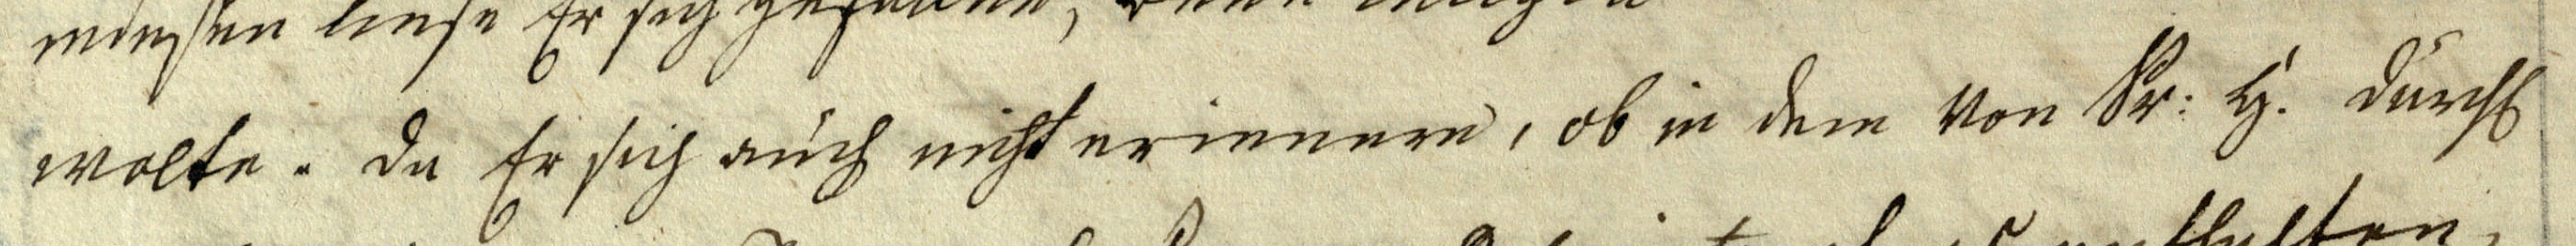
wolte. Da Er sich auch nicht erinnere, ob in dem von Sr H. Durchl
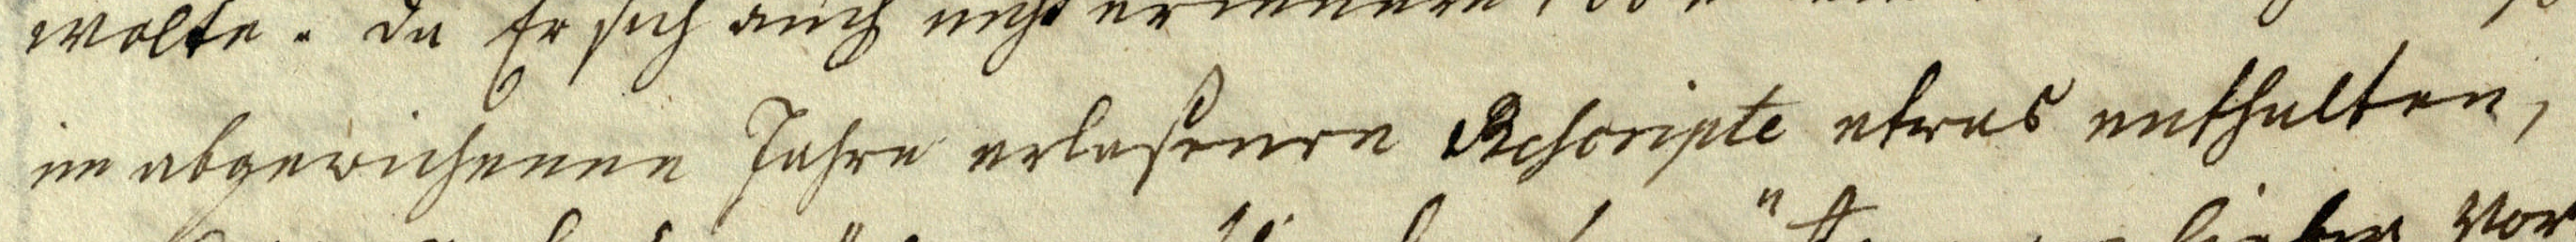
im abgewichenen Jahre erlaßenen Rescripte etwas enthalten,
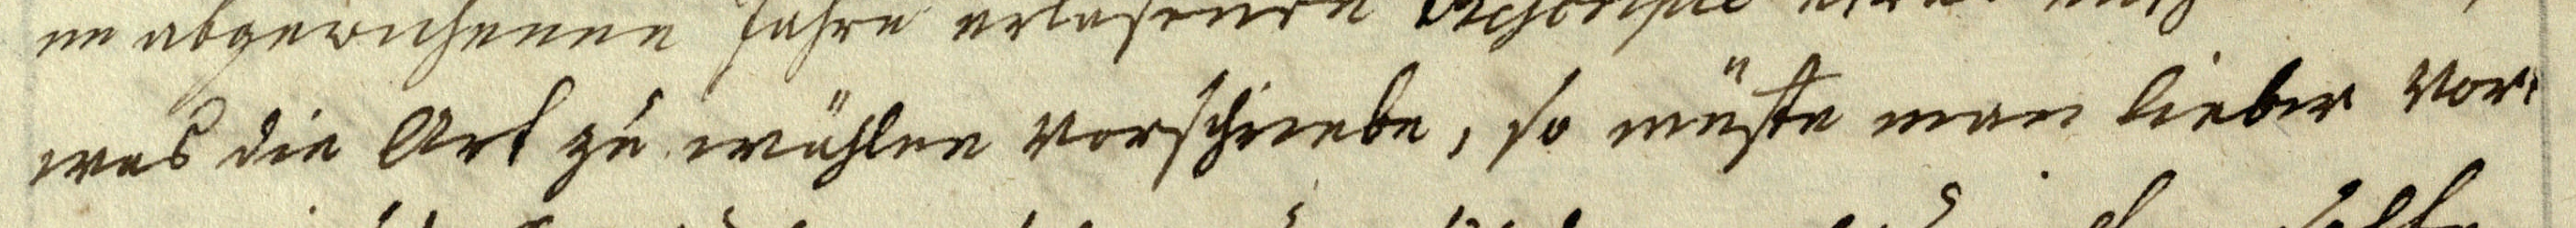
was die Art zu wählen vorschriebe, so müste man lieber vor¬
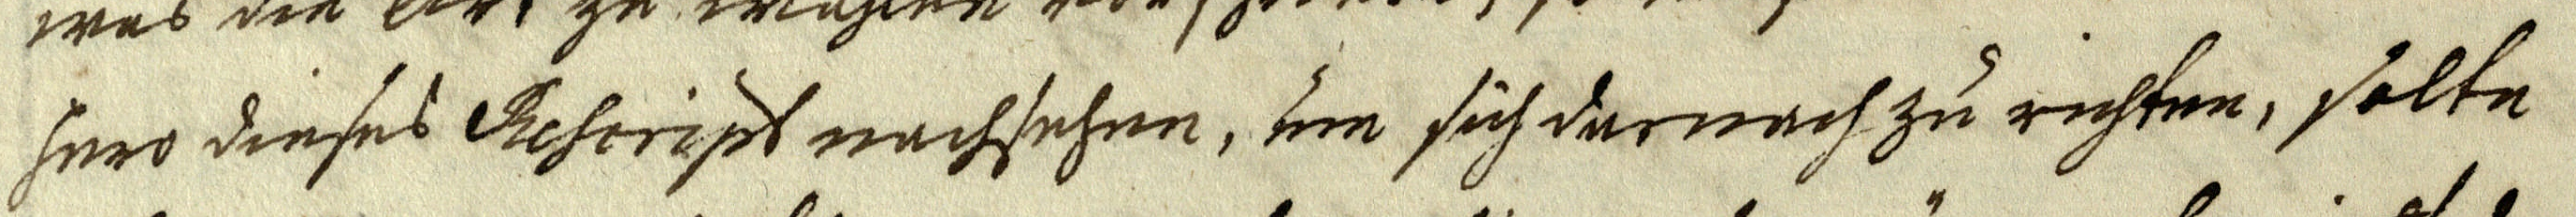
hero dieses Rescript nachsehen, um sich darnach zu richten, solte
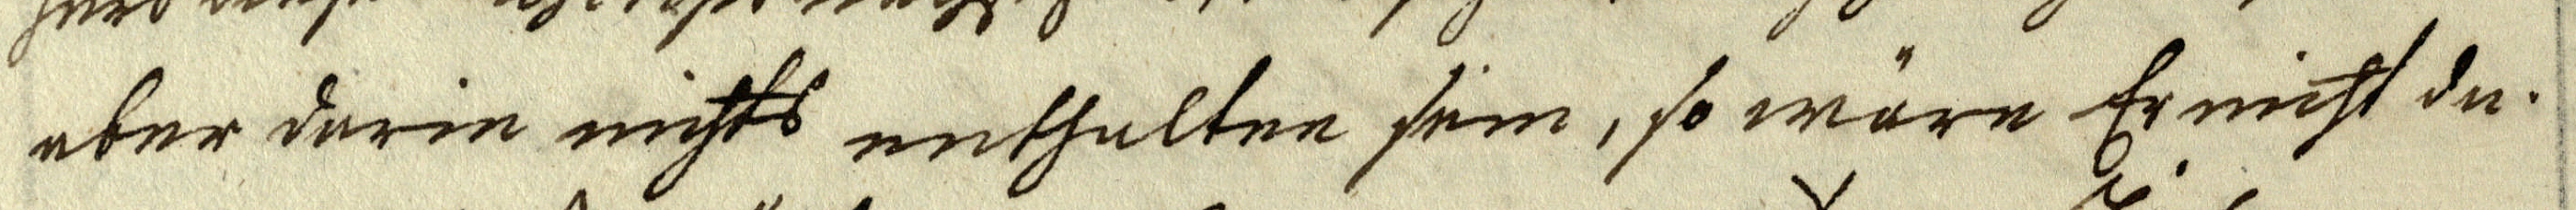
aber darin nichts enthalten sein, so wäre Er nicht da¬
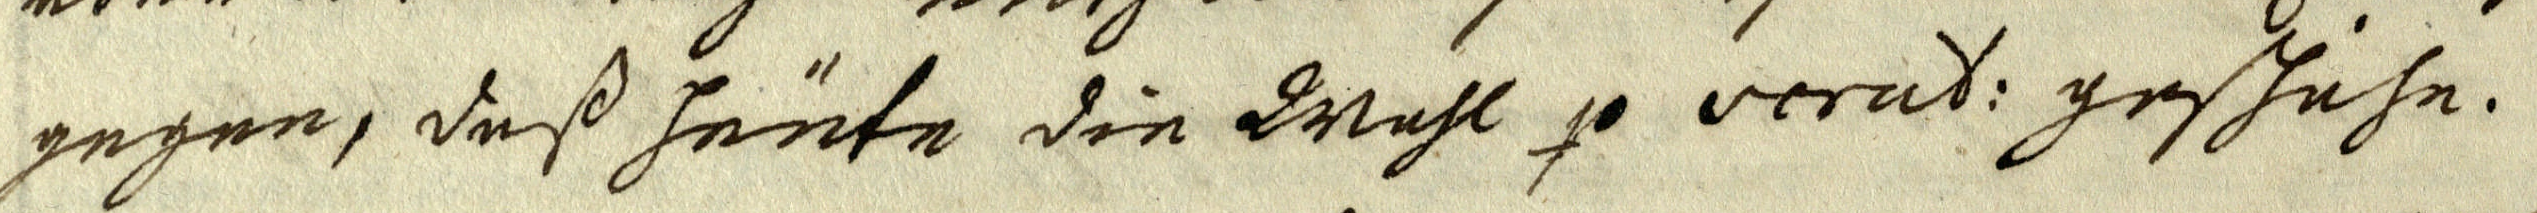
gegen, daß heute die Wahl p. scrut. geschähe.
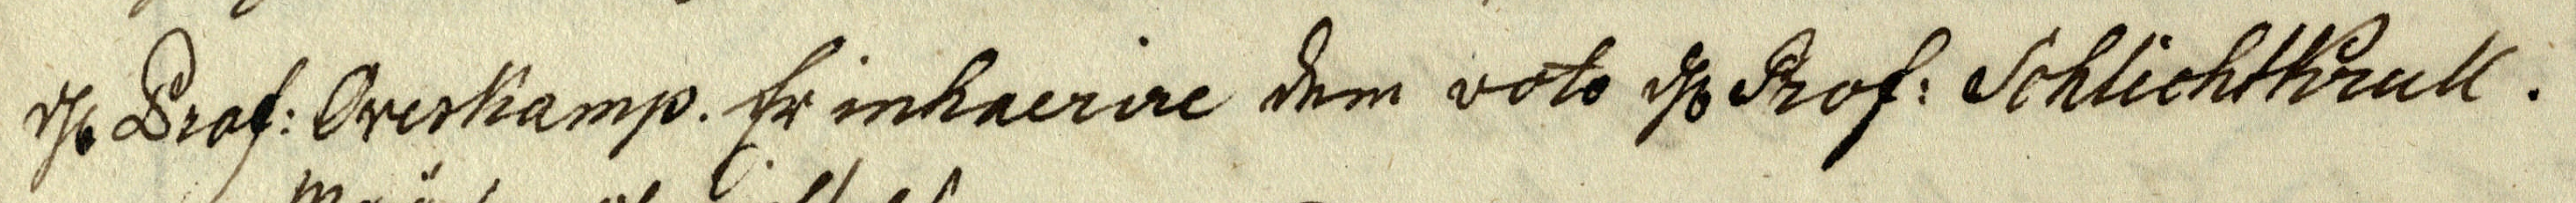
dh Prof. Overkamp. Er inhaerire dem voto dh Prof. Schlichtkrull.
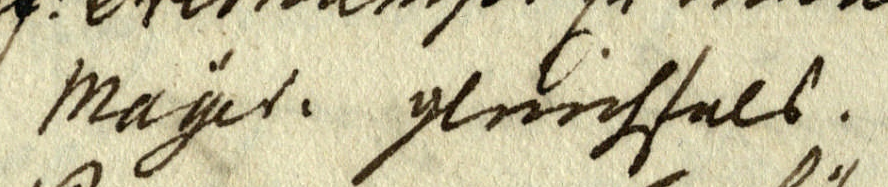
Maÿer. gleichfals.
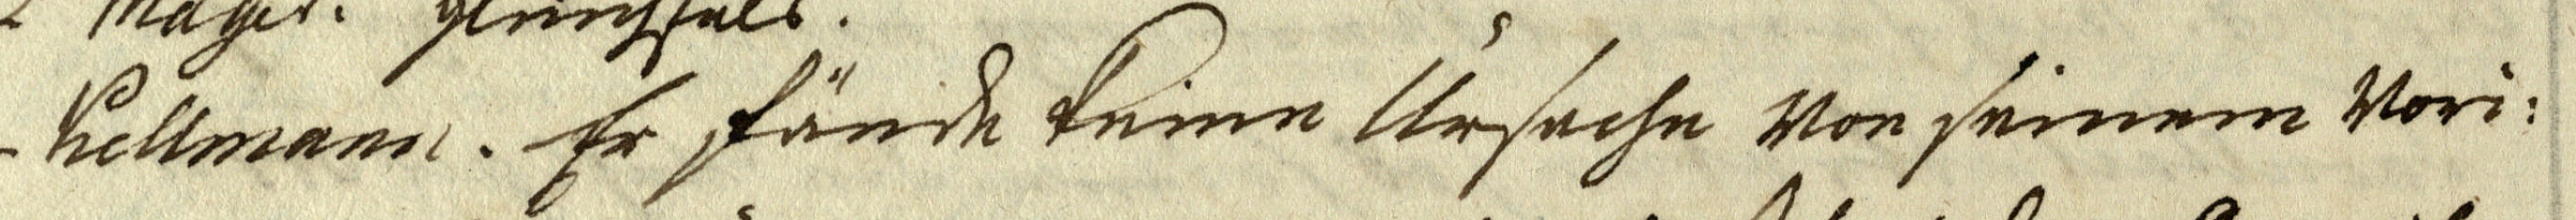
Kellmann. Er fände keine Ursache von seinem vori¬
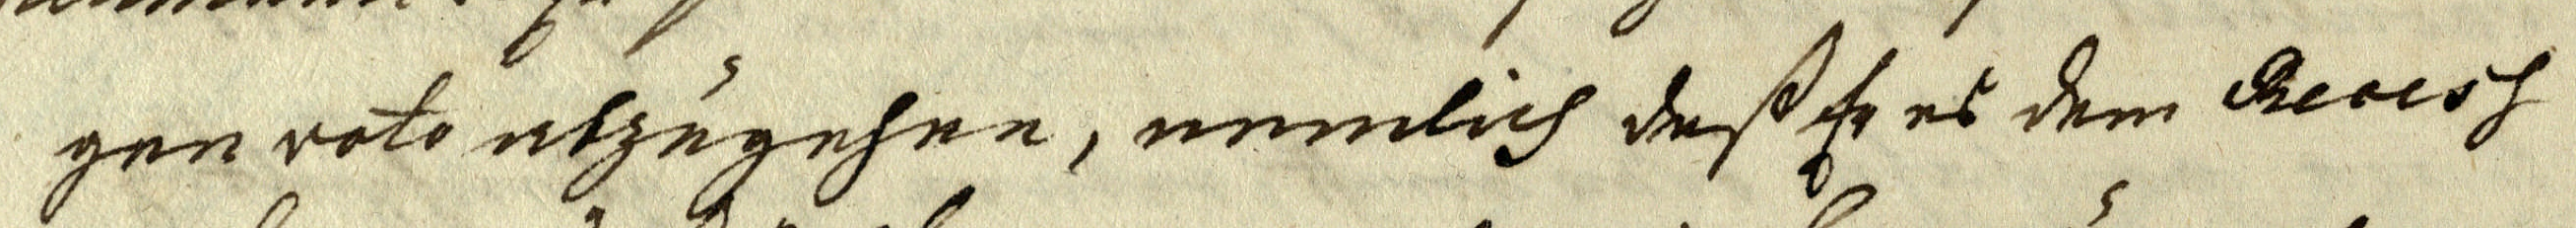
gen voto abzugehen, nemlich daß Er es dem Recess
